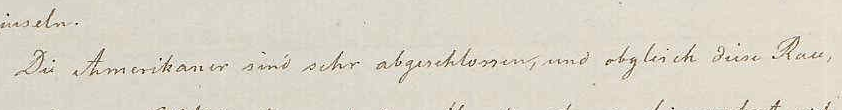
Die Amerikaner sind sehr abgeschlossen, und obgleich diese Race,
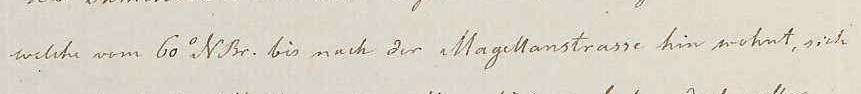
welche vom 60° NBr. bis nach der Magellanstrasse hin wohnt sich
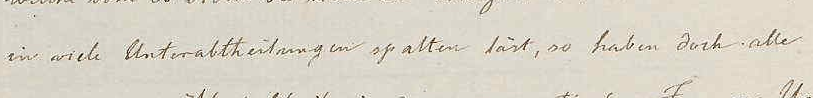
in viele Unterabtheilungen spalten läst, so haben doch alle
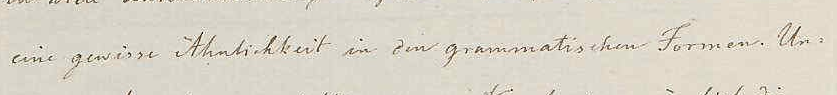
eine gewisse Ähnlichkeit in den grammatischen Formen. Un-
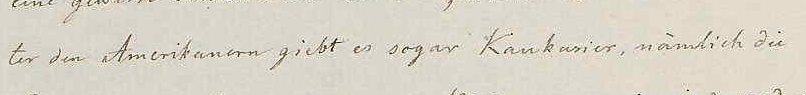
ter den Amerikanern giebt es sogar Kaukasier, nämlich die
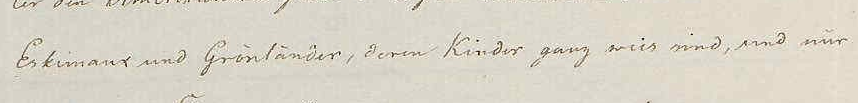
Eskimaux und Grönländer, deren Kinder ganz weis sind, und nur
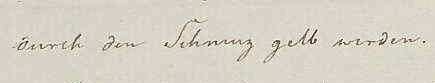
durch den Schmuz gelb werden.
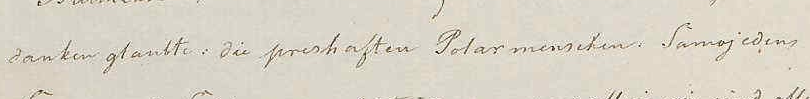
danken glaubte: die preshaften Polarmenschen: Samojeden,
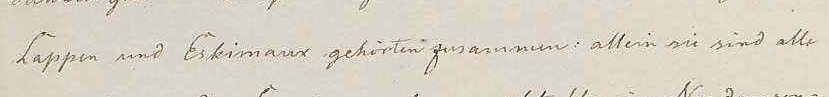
Lappen und Eskimaux gehörten zusammen: allein sie sind alle
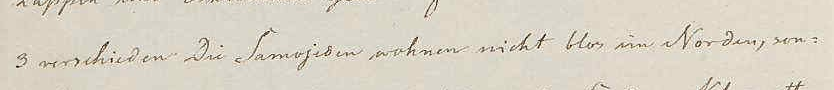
3 verschieden. Die Samojeden wohnen nicht blos im Norden, son-
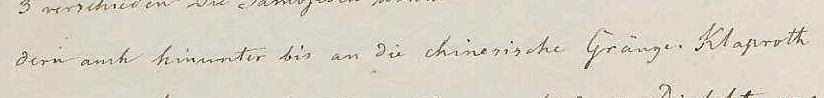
dern auch hinunter bis an die chinesische Gränze. Klaproth
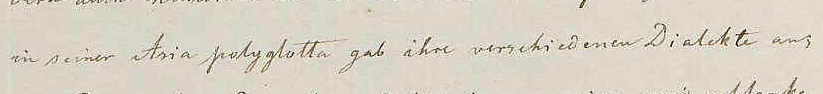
in seiner Asia polyglotta gab ihre verschiedenen Dialekte an;
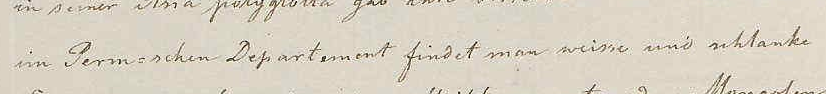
im Perm-schen Departement findet man weisse und schlanke
